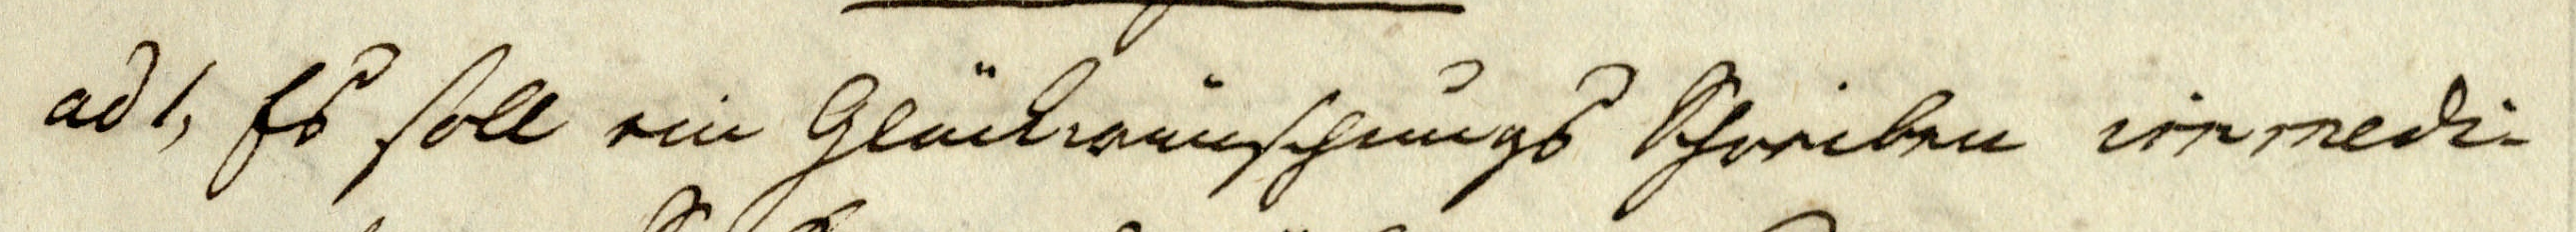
ad 1, Es soll ein Glückwünschungs Schreiben immedi¬
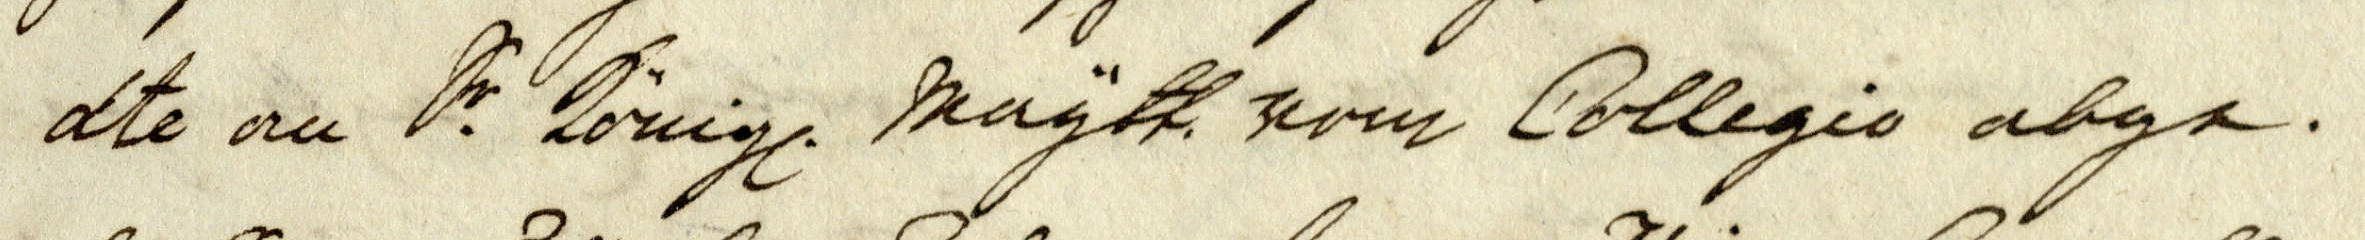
ate an Sr. Königl. Maÿtt. vom Collegio abge¬
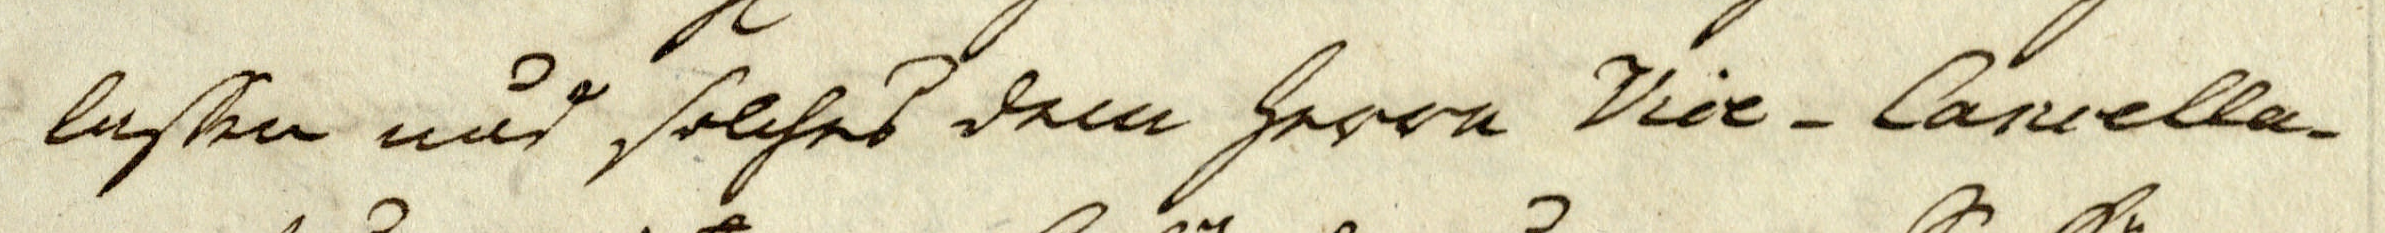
lassen und solches dem Herrn Vice-Cancella¬
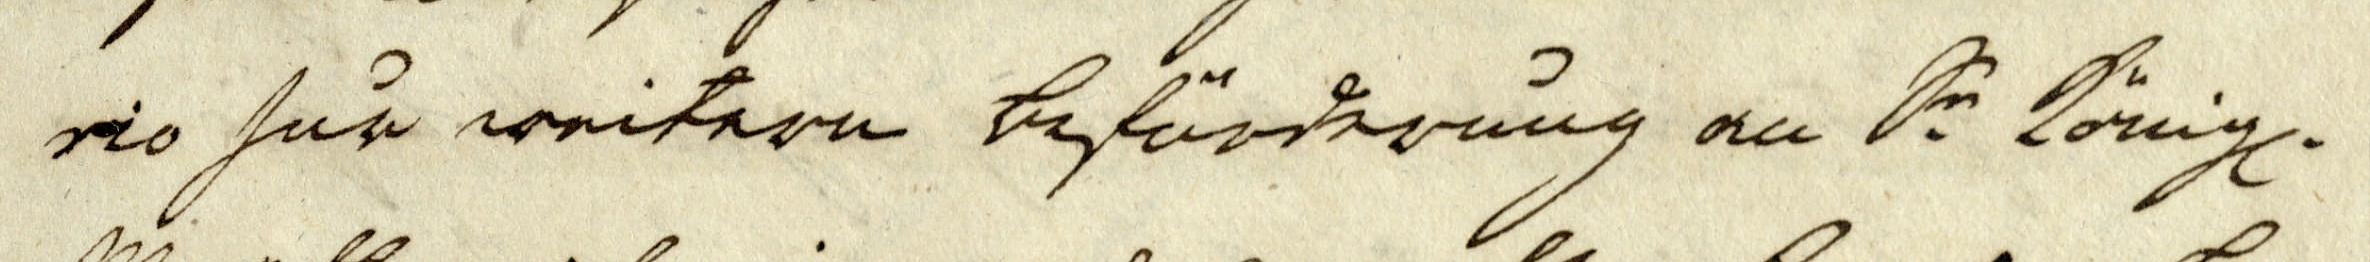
rio zur weitern Beförderung an Sr Königl.
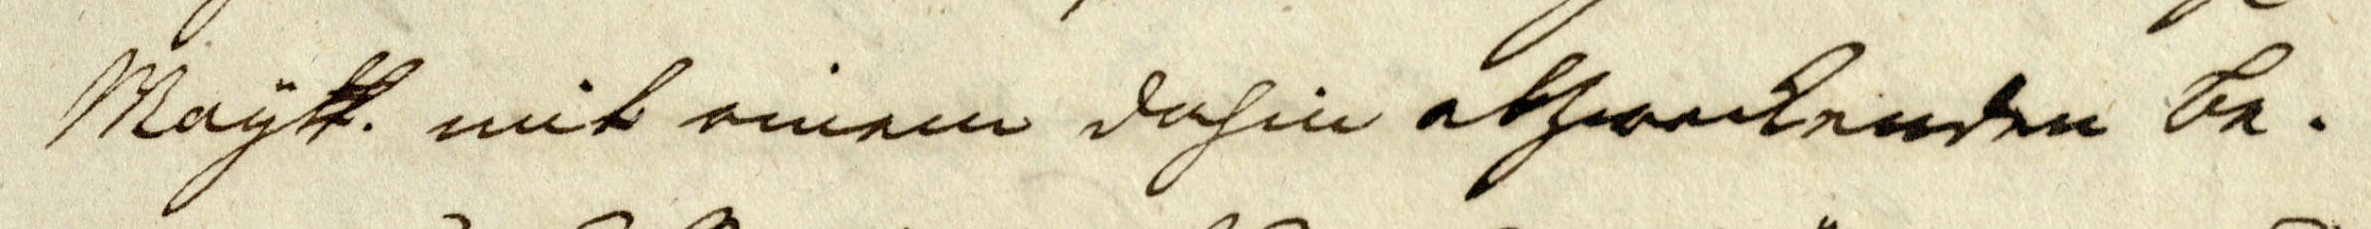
Maÿtt. mit einem dahin abzweckenden Be¬
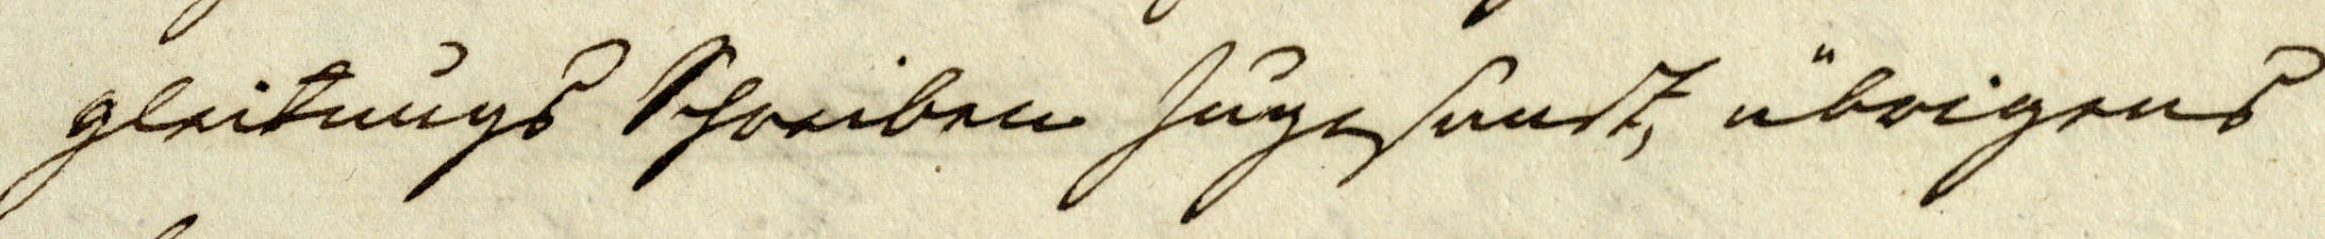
gleitungs Schreiben zugesandt, übrigens
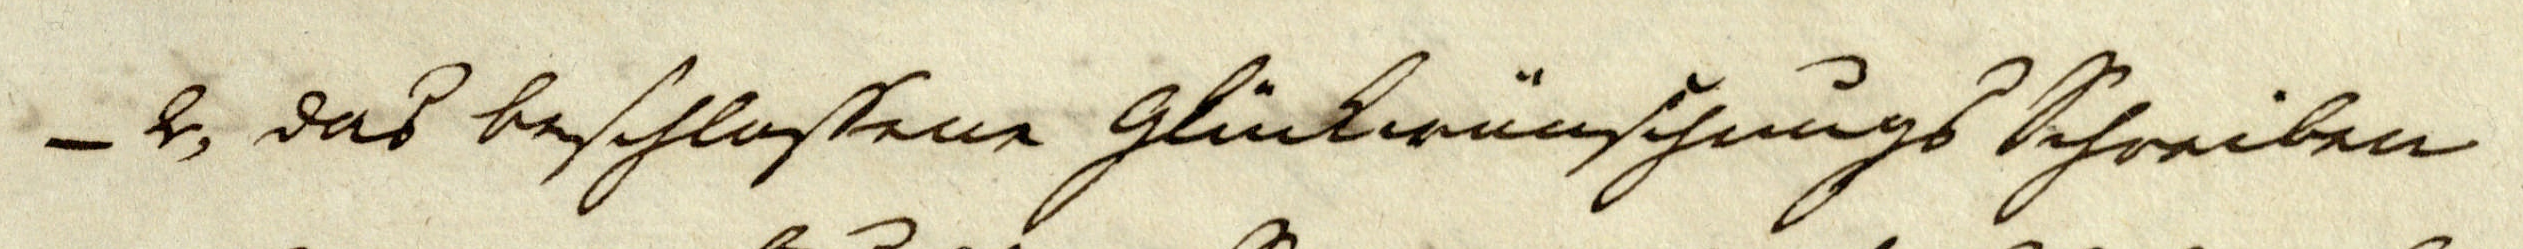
2., das beschlossene Glückwünschungs Schreiben
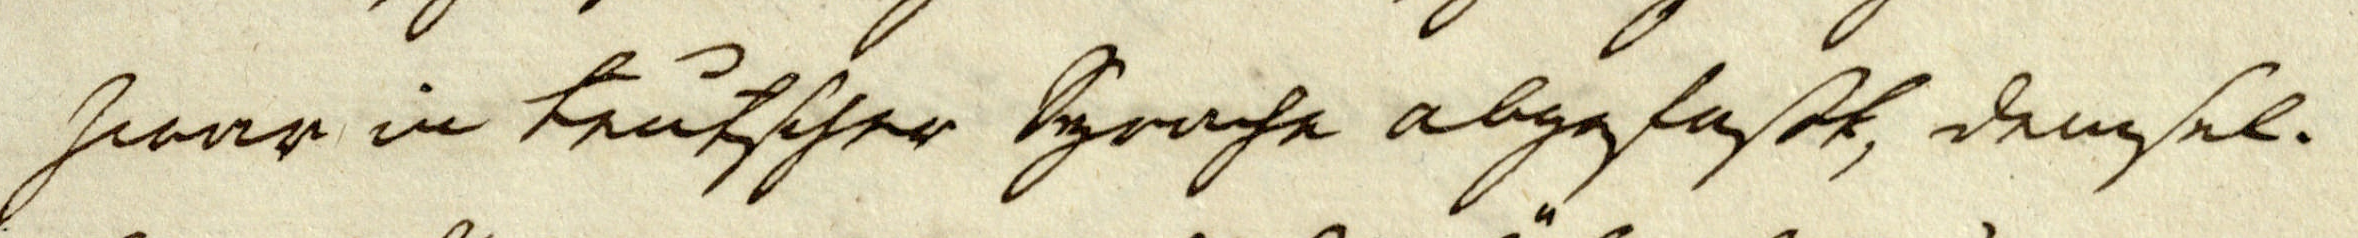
zwar in teutscher Sprache abgefaßt, demsel¬
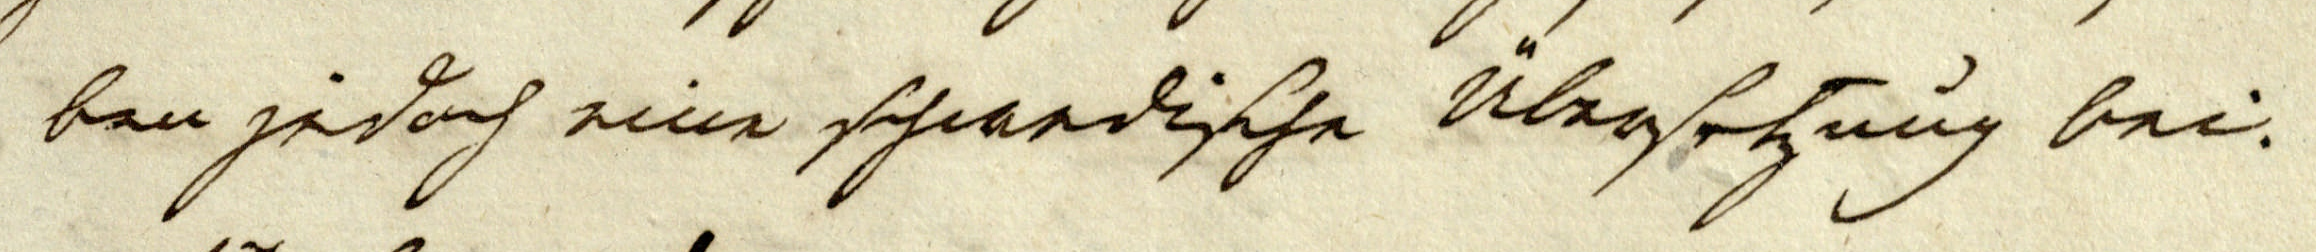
ben jedoch eine schwedische Übersetzung bei¬
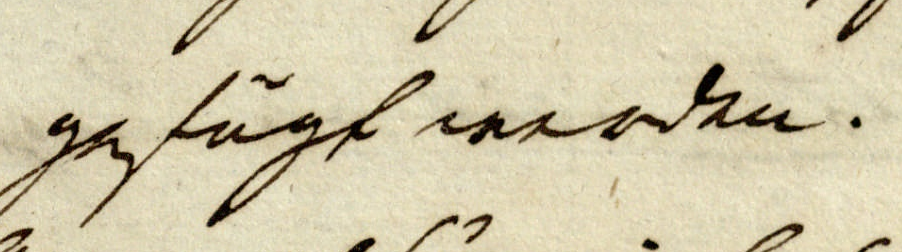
gefügt werden.
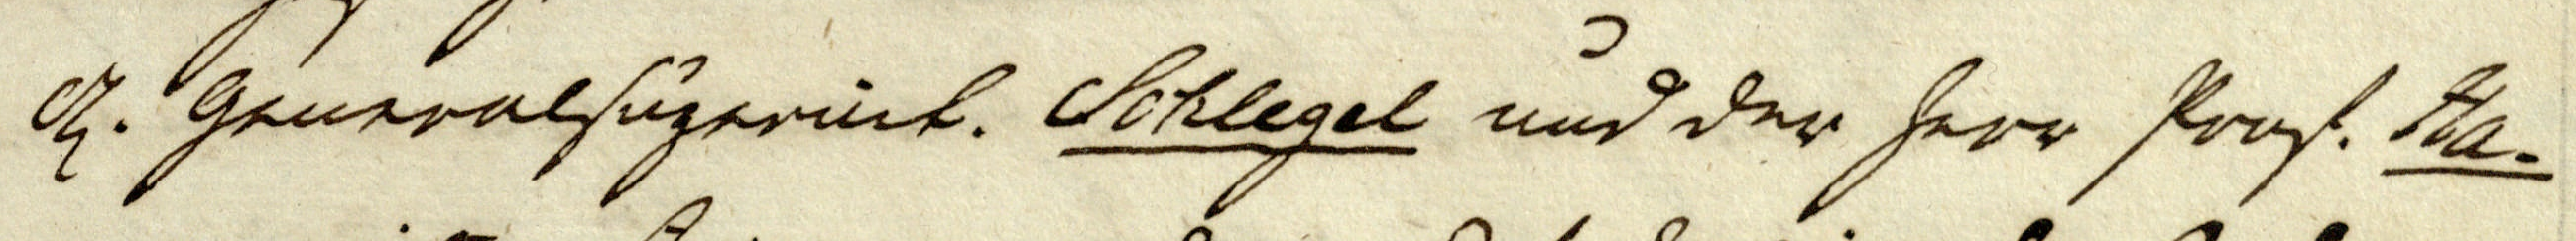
dh. Generalsuperint. Schlegel und der Herr Prof. Ha¬
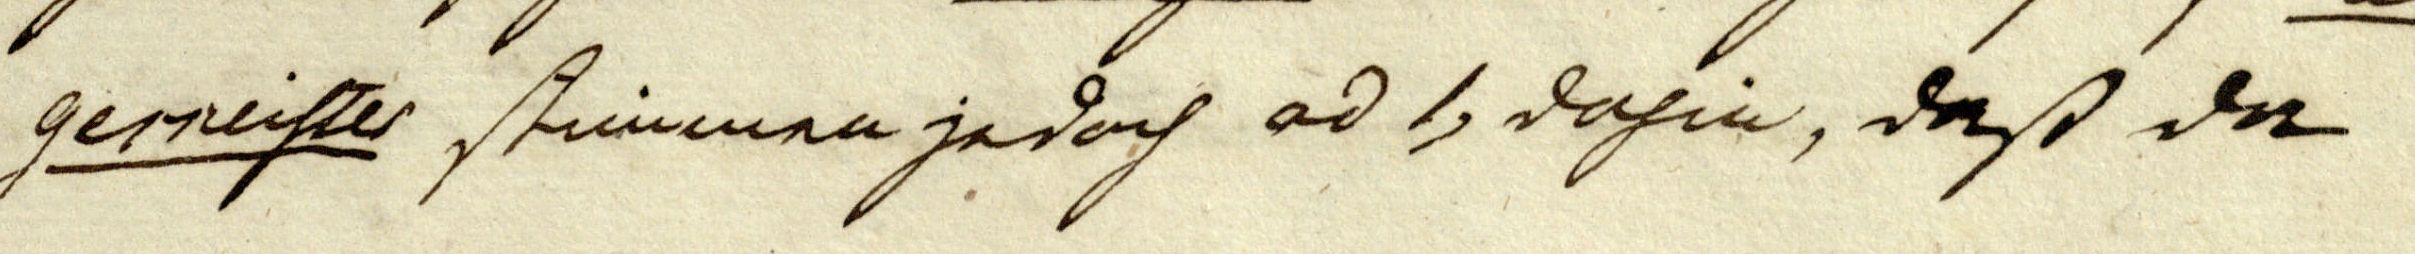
gemeister stimmen jedoch ad 1., dahin, daß da
